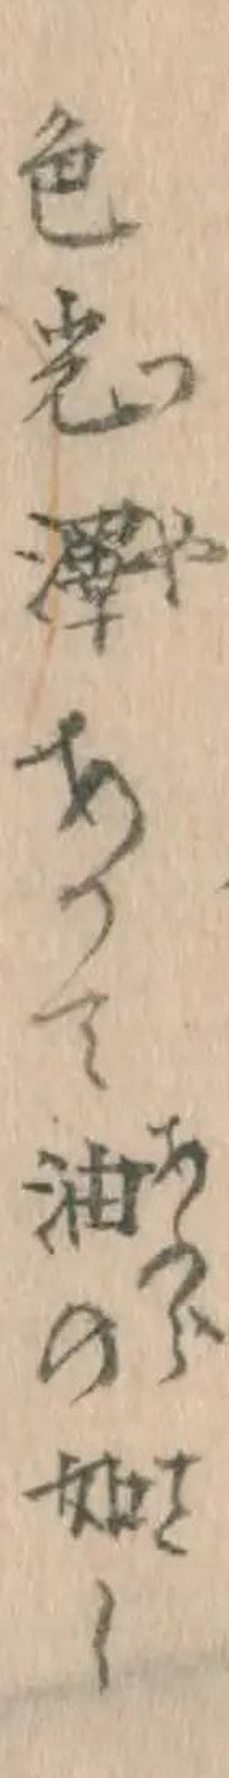色光沢ありて油の如し

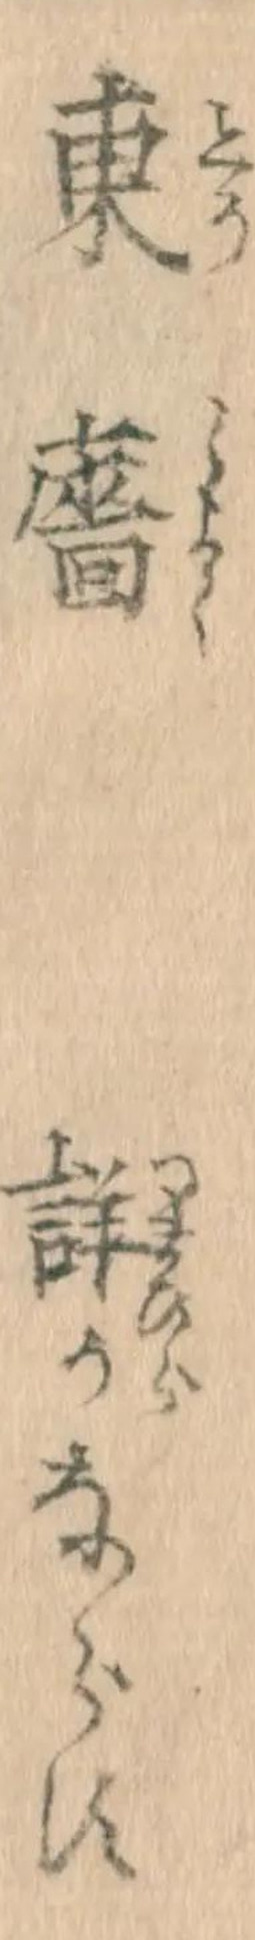東廧詳かならす
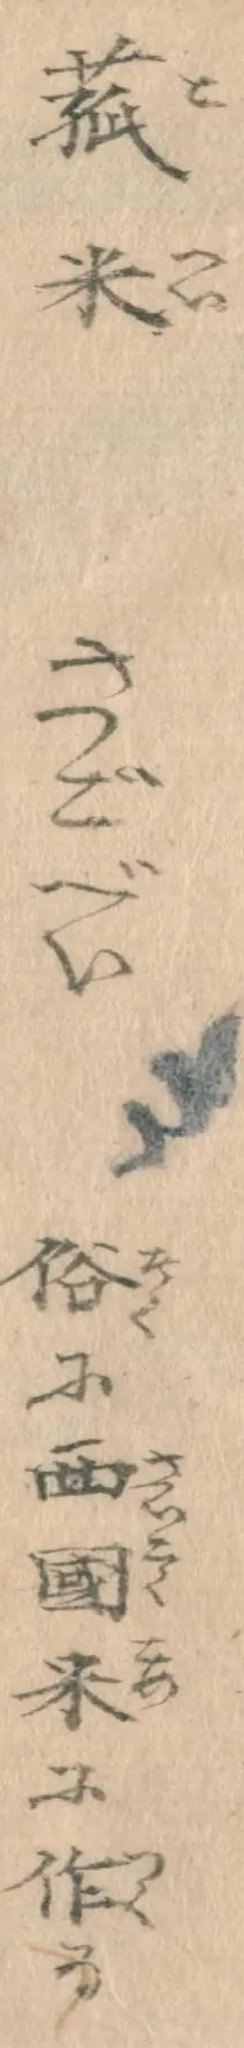菰米さごべい俗に西国米に作る
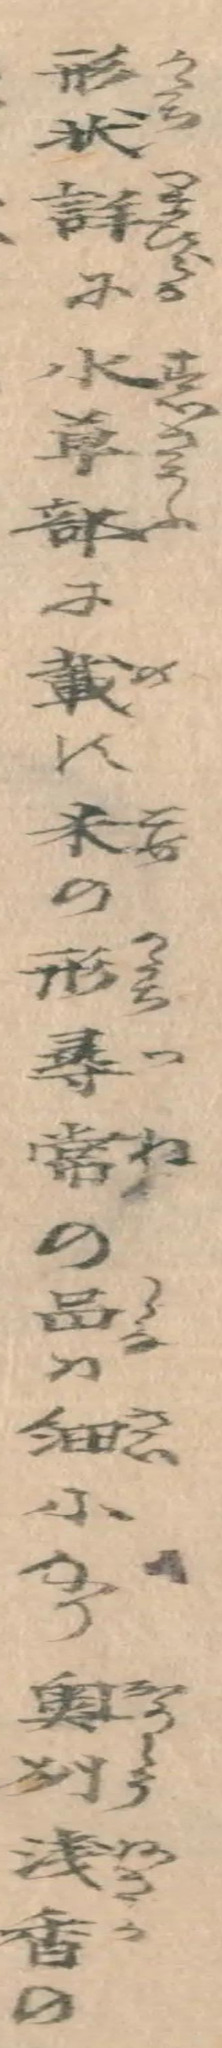形状詳に水草部に載す米の形尋常の品は細小なり奥州浅香の
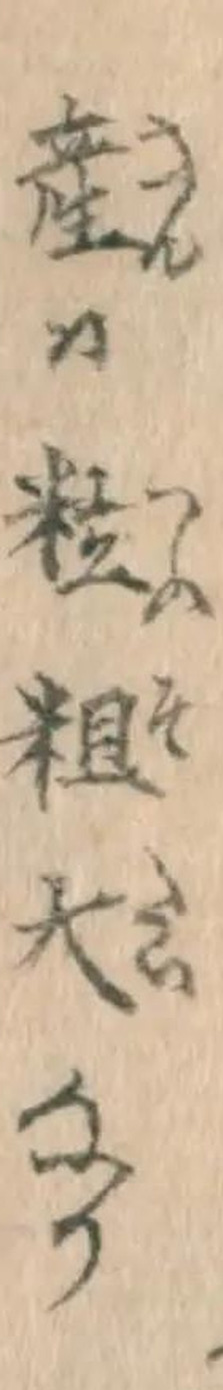産は粒粗大なり
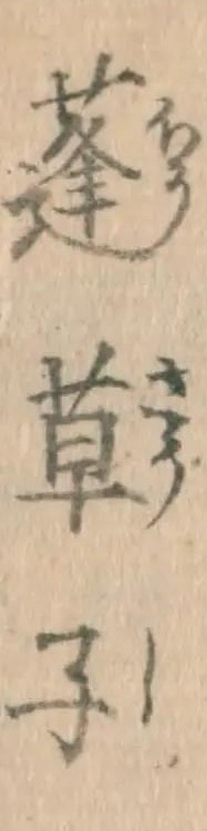蓬草子
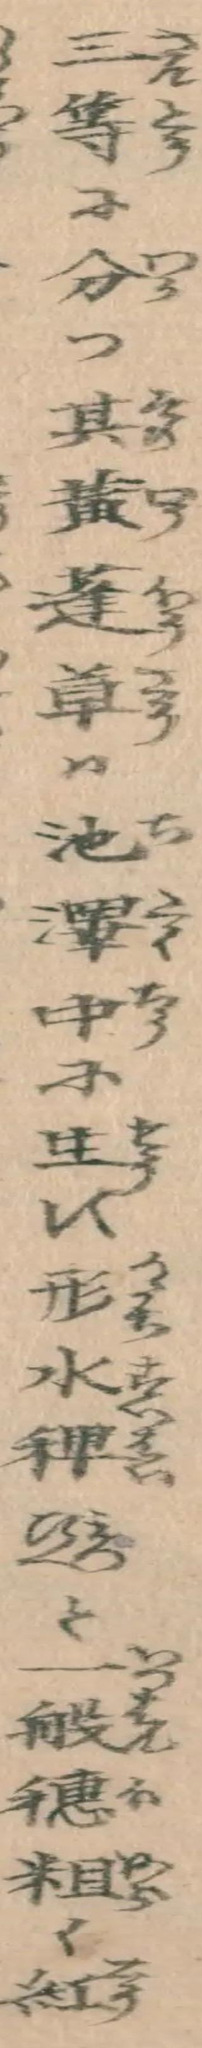三等に分つ其黄蓬草は池沢中に生す形水稗みつひへと一般穂粗く紅
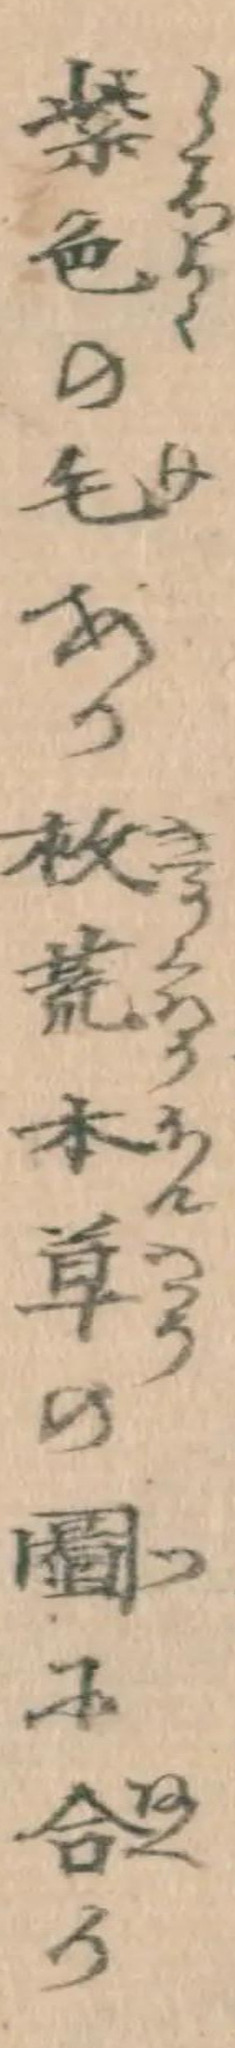紫色の毛あり救荒本草の図に合り
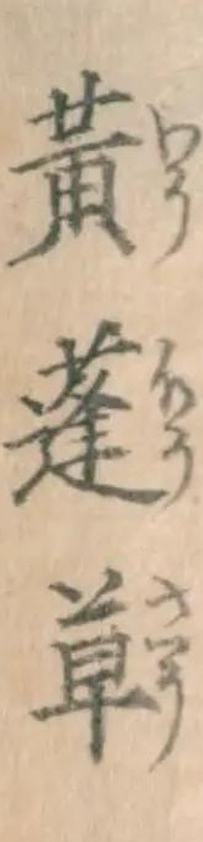黄蓬草

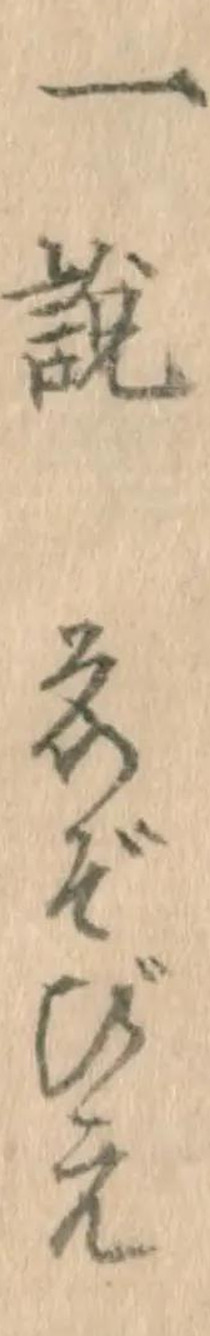一説ゑぞびえ
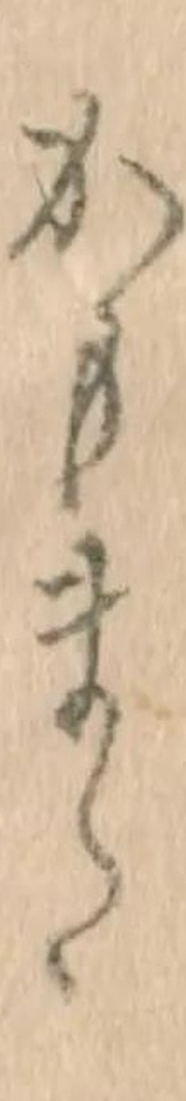かもまた
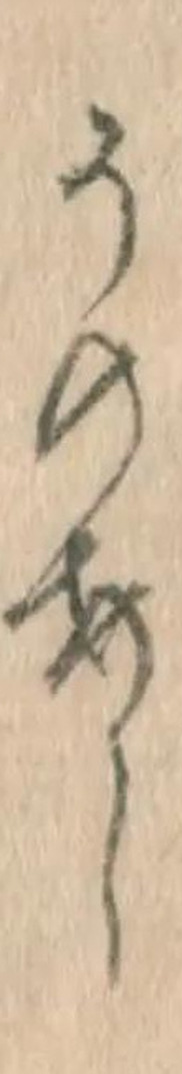うのあし
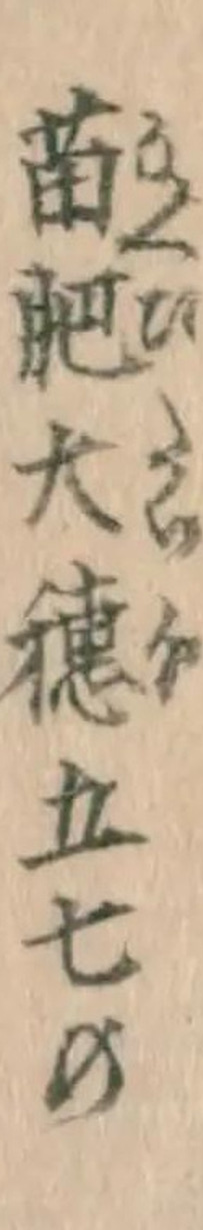苗肥大穂五七の
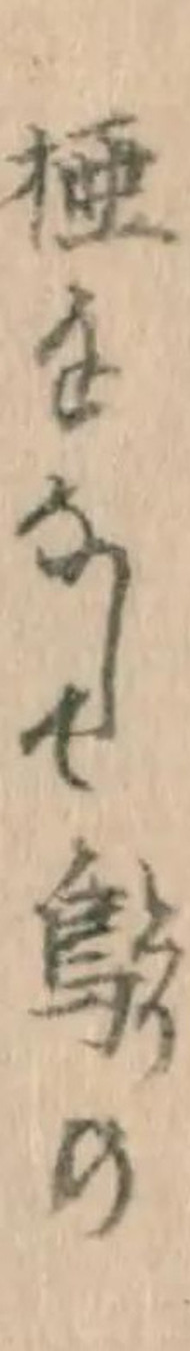椏をなして鳥の
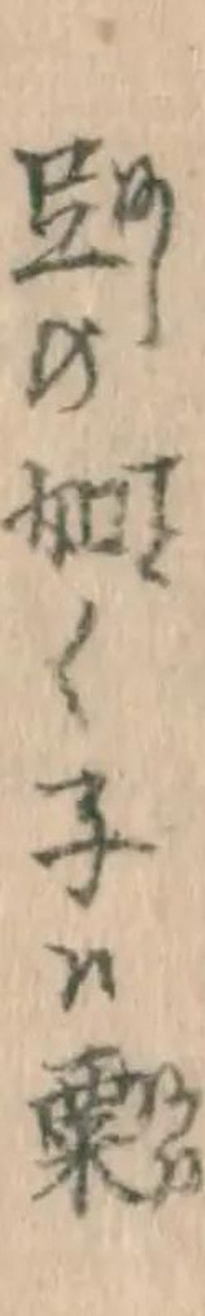足の如く子は粟
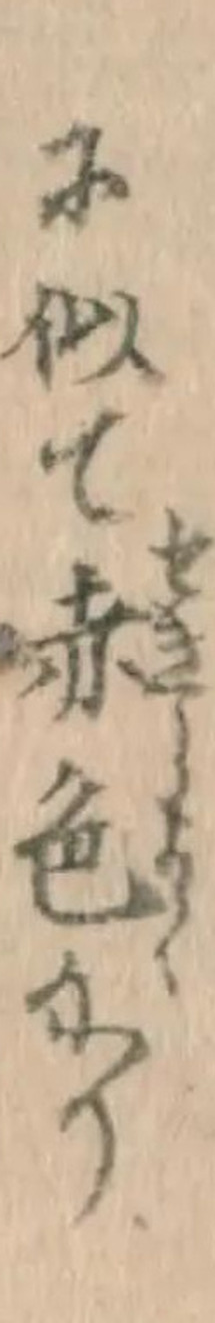に似て赤色なり
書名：本草図譜. 巻40-42
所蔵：国立国会図書館 National Diet Library, JAPAN
